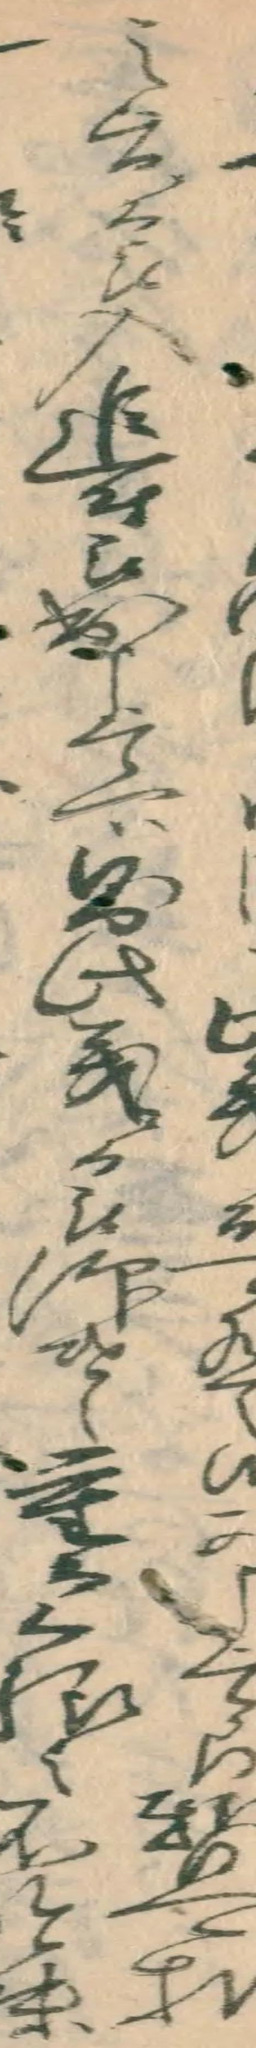之旨ニ而被入追付被出申上候へハ則此義ニ而被仰遣候重而ケ様之不吟味
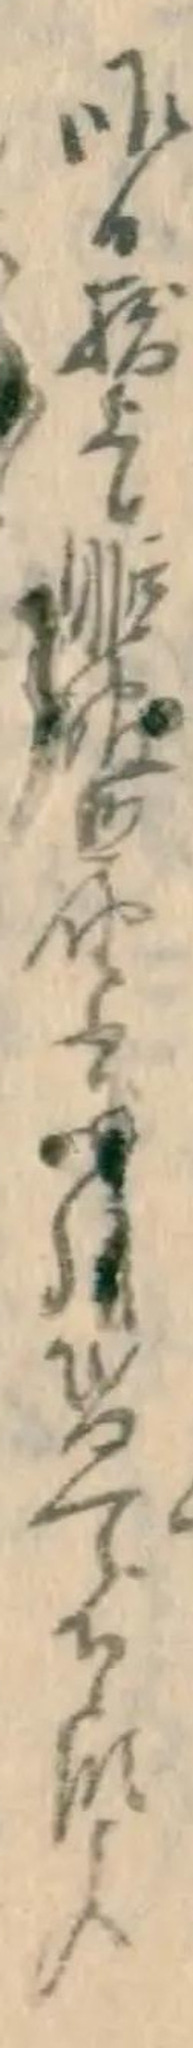昨日指上候暇服御届書御引替可被下段申入
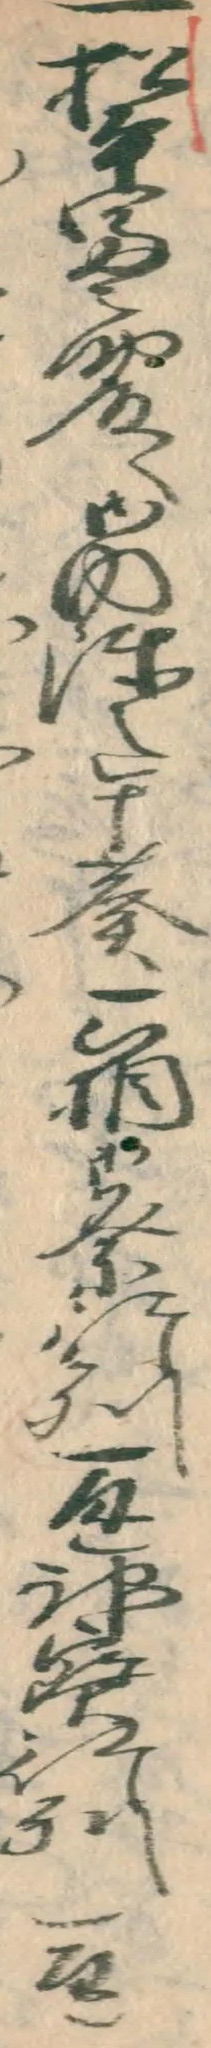一松平富之助殿へ御内陣之干葵一箱御祭行列礼一通神宝行列一通
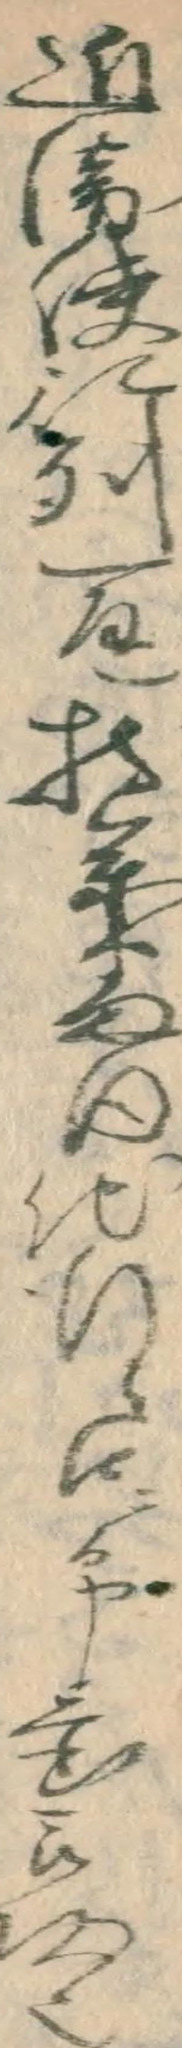近衛使行列一通持参番内他行之由ニ而申置被帰也
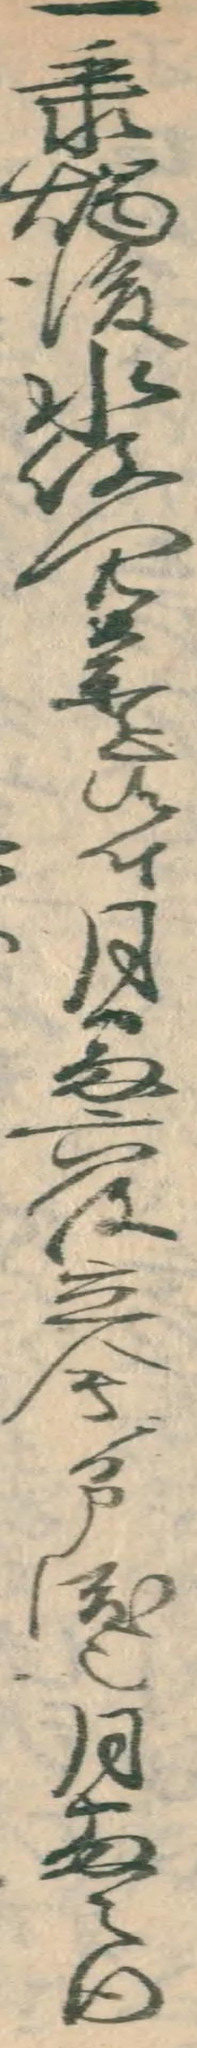一秉燭後水役人共参上候ニ付月番六役立会ニ而申渡也月番之内
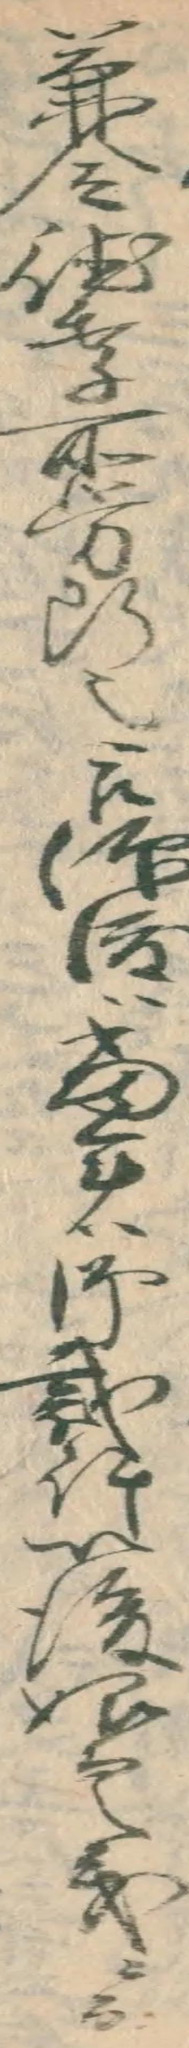兼令徳季所労断也被仰渡ハ当年ハ御裁許以後始而之義ニ而
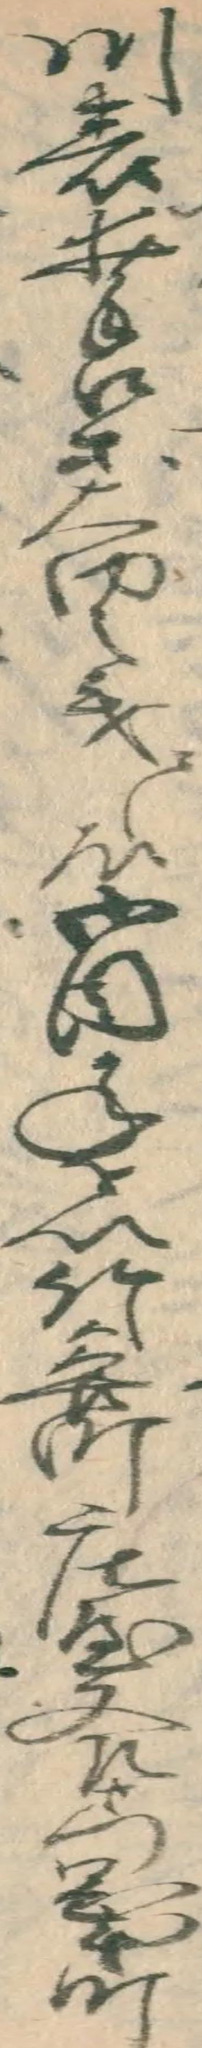川表井手口等大切之義ニ候故御目かねを以竹鼻町庄屋又左衛門岡本町
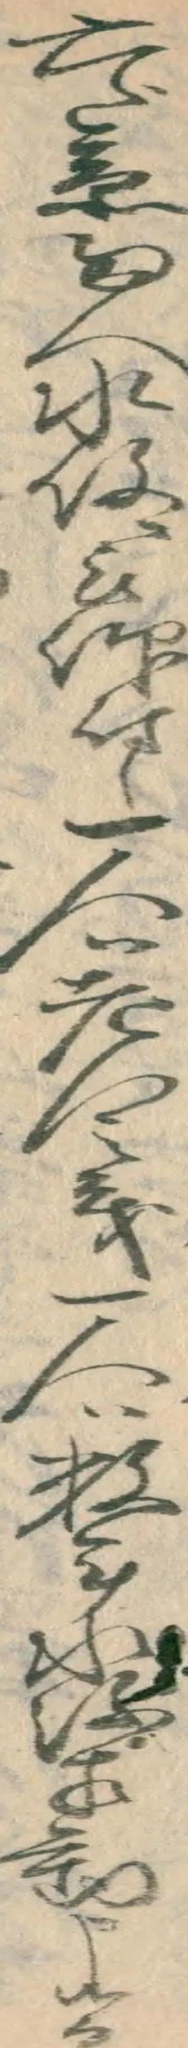六郎兵衛両人水役ニ被仰付候一人ハ老人之義一人ハ数年水役相勤申候而
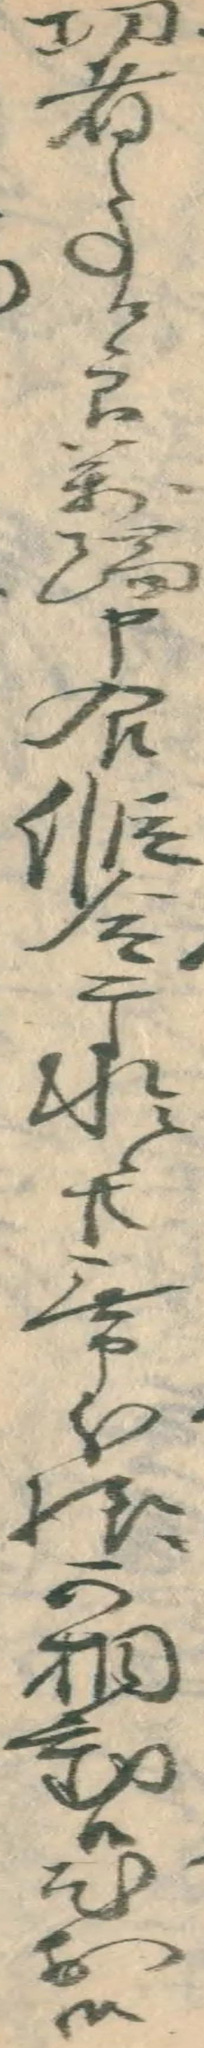功者之事ニ候間万端申合縦令干水ニ候共無申分様ニ可相勤候尤於御
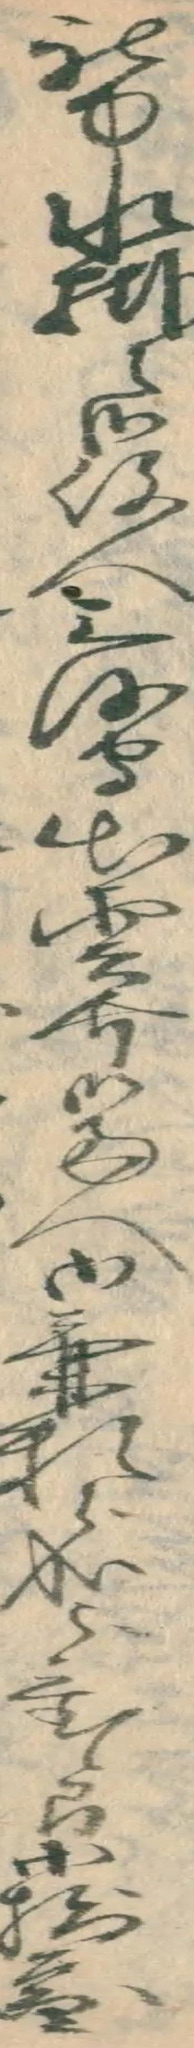社中水掛之御役人三河守出雲介御両人御兼頼被成被置候間御指図
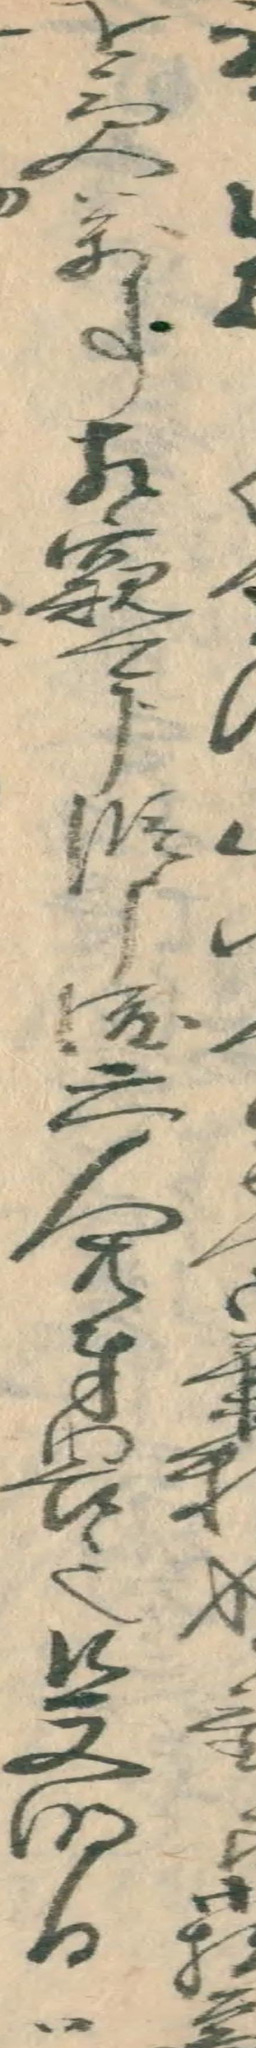を受万事相窺可申段申渡六人共奉畏候也且又明日ハ
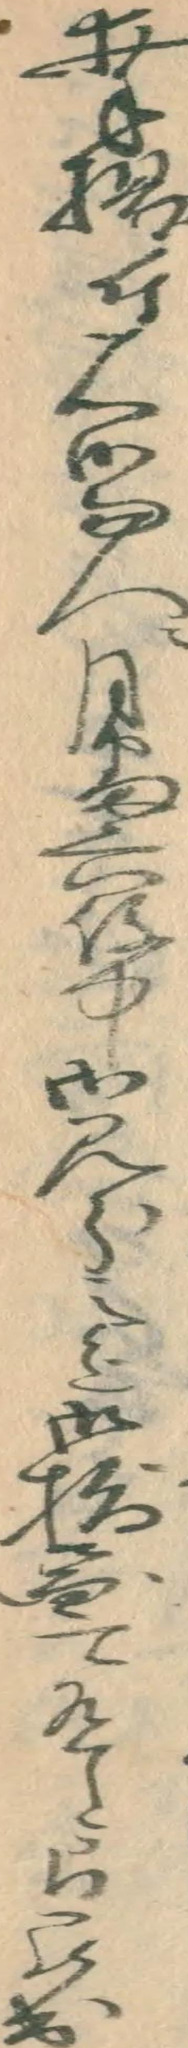井手揚ニ付石御両人ニ月番六役中御見分之上御指図可有之候間罷出

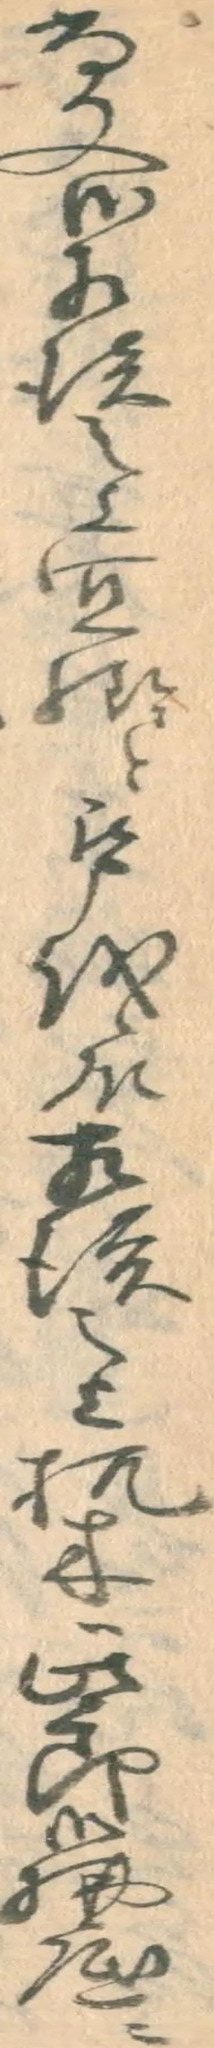尚又御相談之上宜様ニと被申越候故相談之上杭木ハ此節御払底ニ
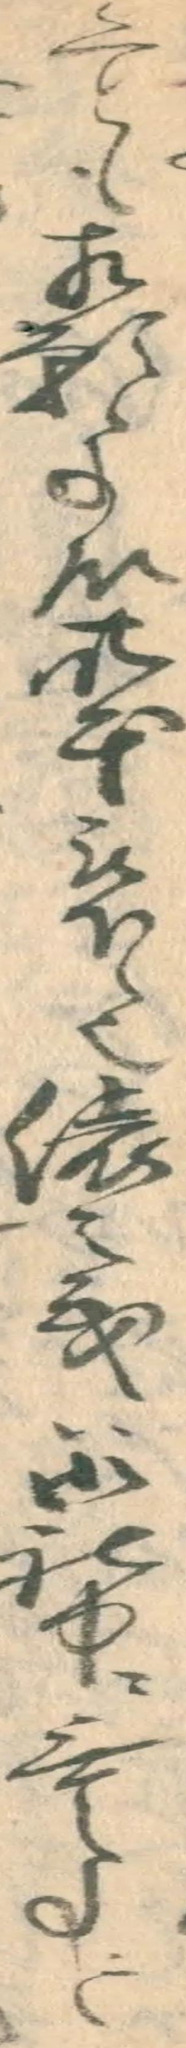候へとも相願候事故卅本被下候也俵之義ハ御社中ニ無之事ニ候
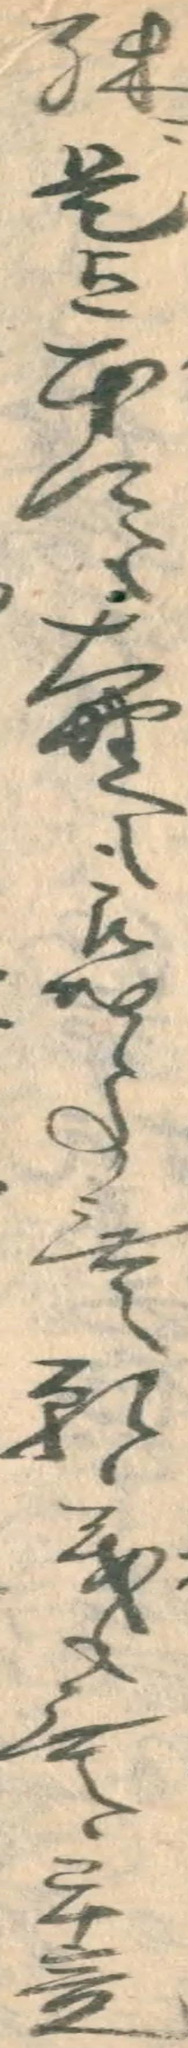殊ニ是迄本郷へも大野へも被遣候事無之願候義も無之候畢竟
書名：賀茂社記録. 第58冊
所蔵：国立国会図書館 National Diet Library, JAPAN
